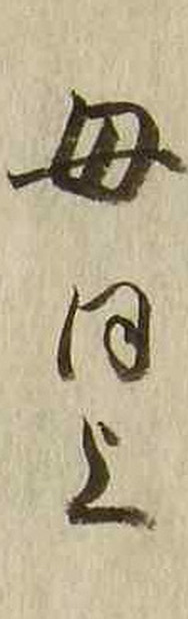母同上
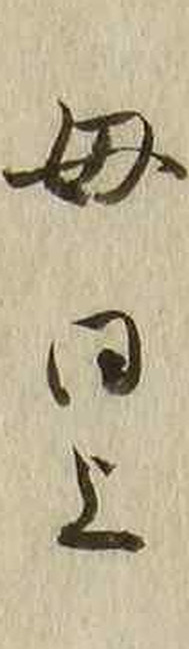母同上
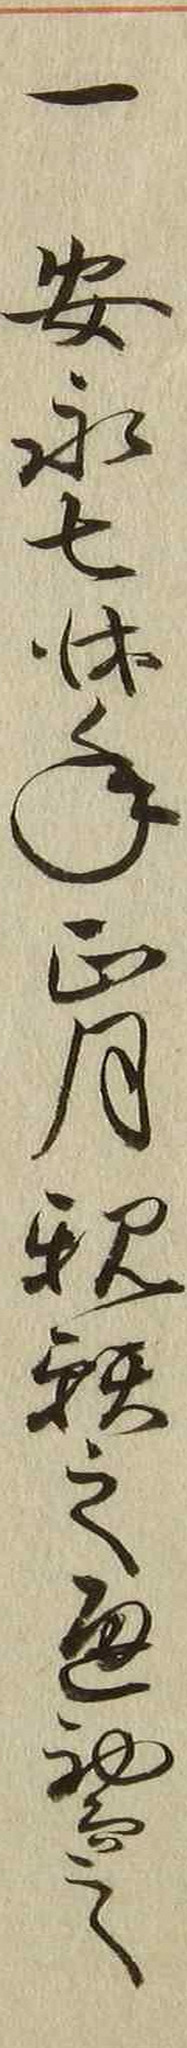一安永七戌年正月親願之通初而之
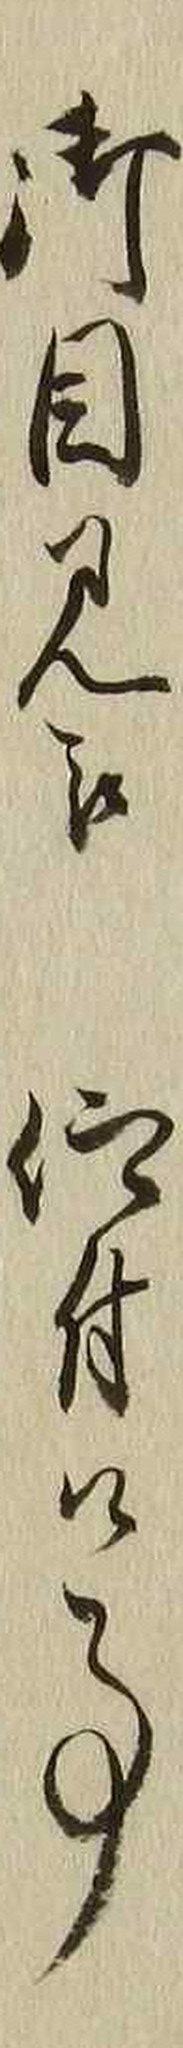御目見被仰付候事
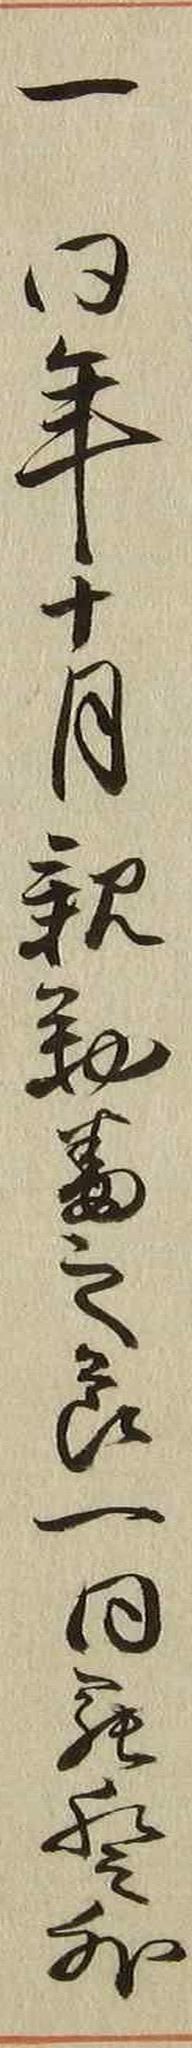一同年十月親勤番之節一同罷登外
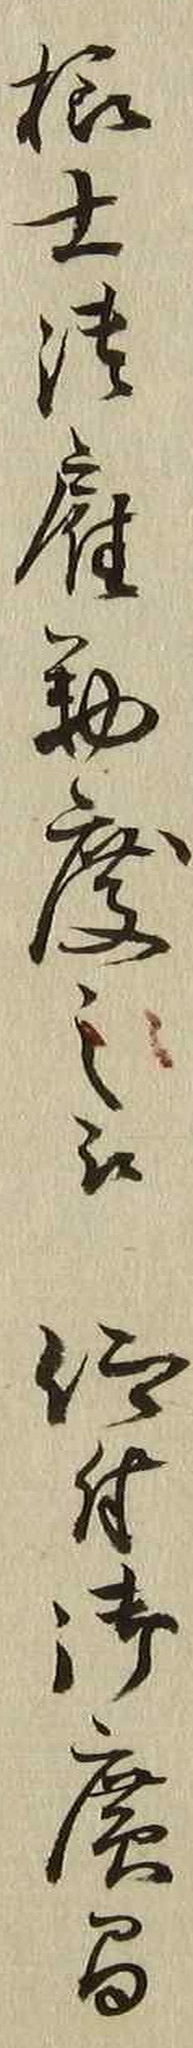様士御雇勤度之被仰付御広間
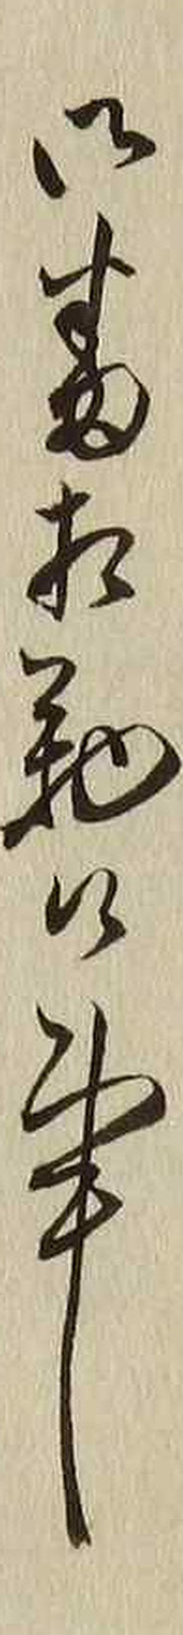御番相勤候事
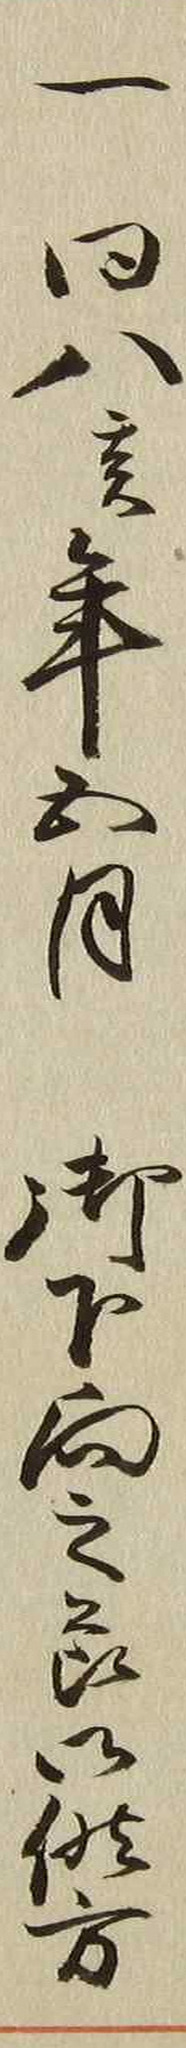一同八亥年五月御下向之節御供方
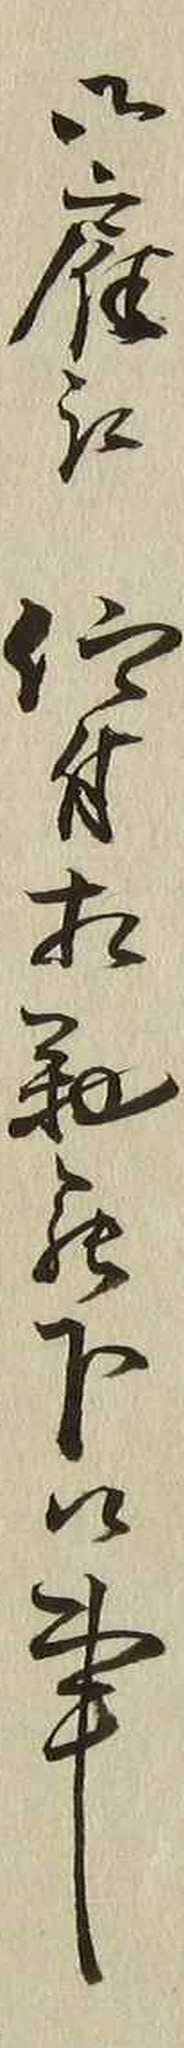御雇被仰付相勤罷下候事
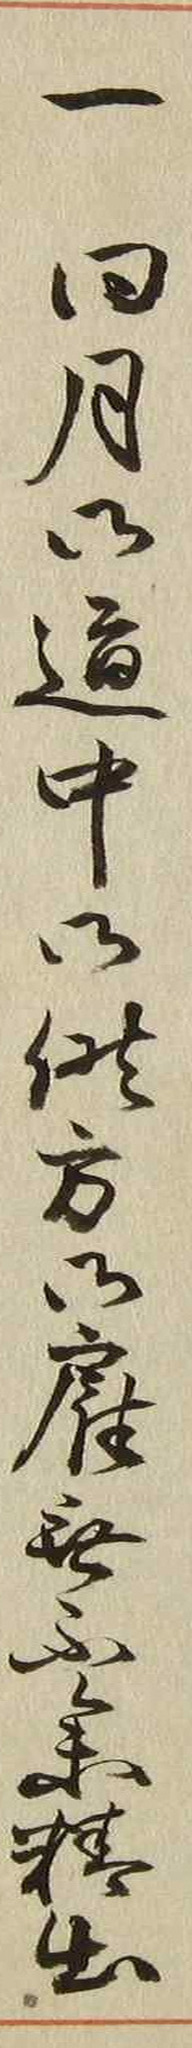一同月御道中御供方御雇無不参精出
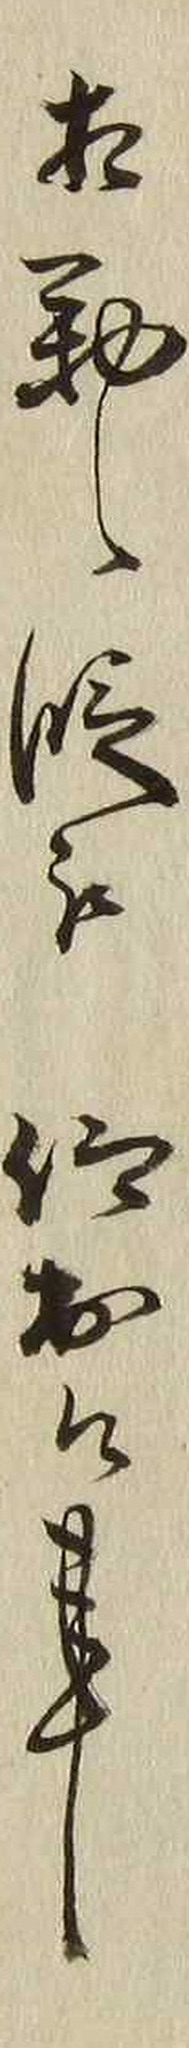相勤候段被仰出候事
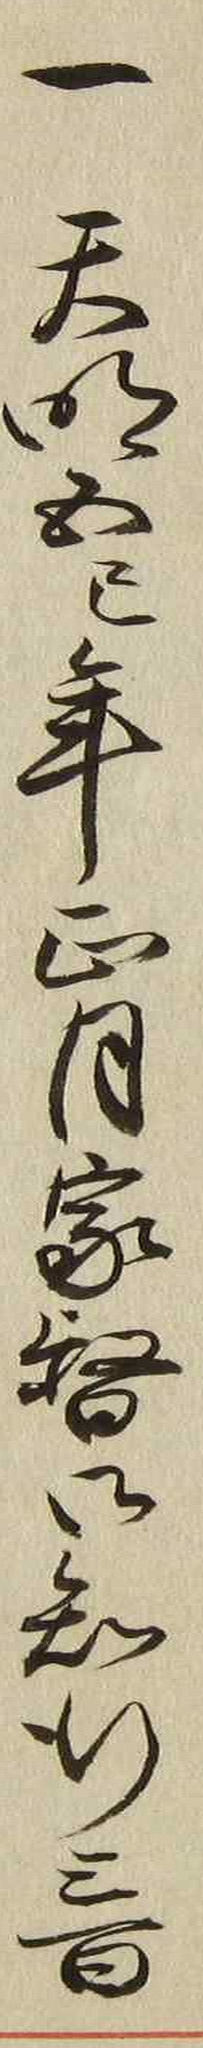一天明五巳年正月家督御知行三百
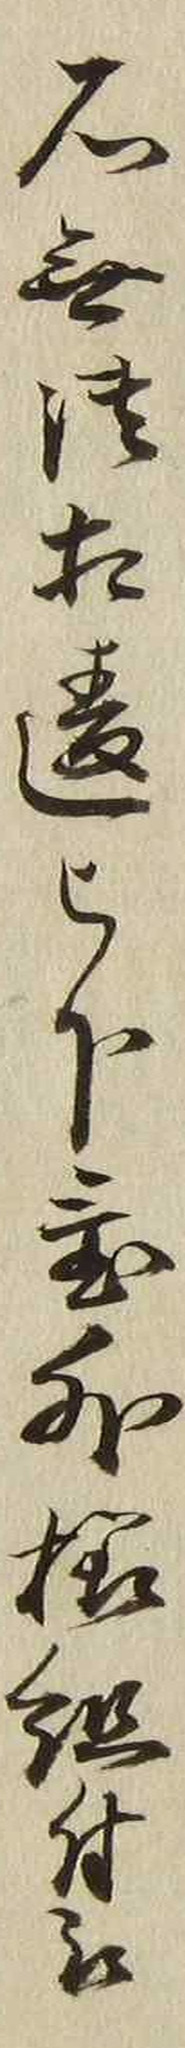石無御相違被下置外様組付被
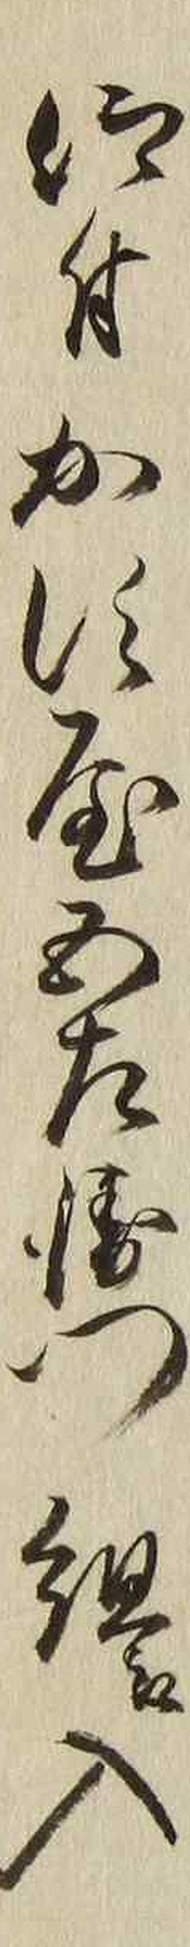仰付加須屋五左衛門組江入
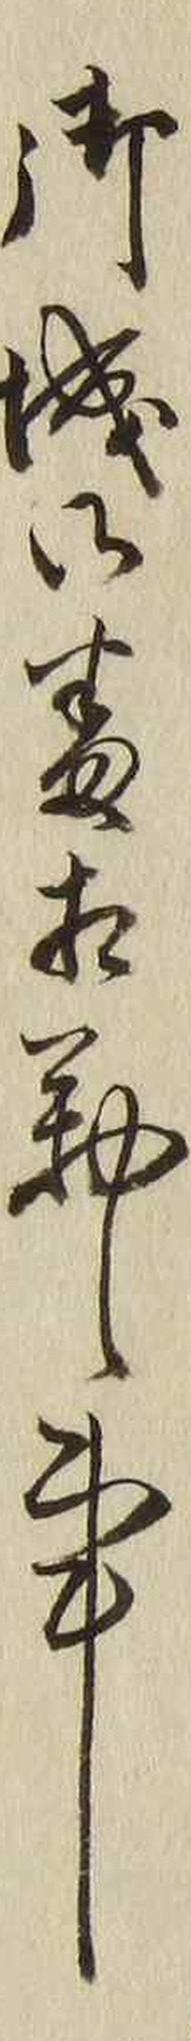御城御番相勤候事
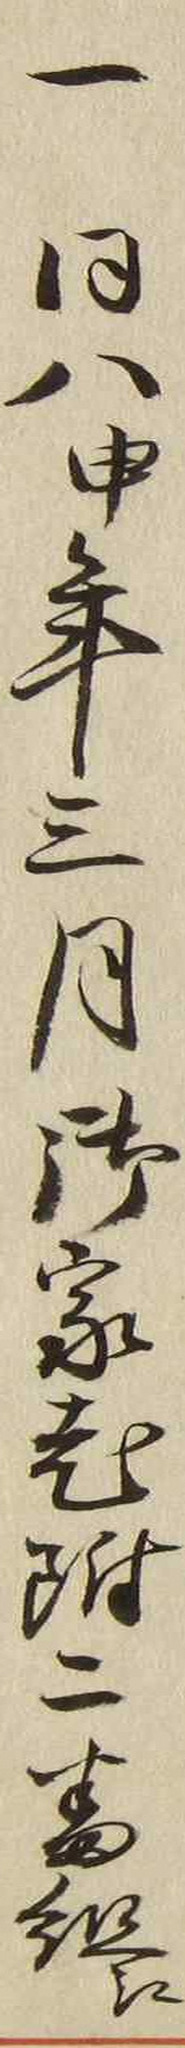一同八申年三月御家老附二番組江
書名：諸士系譜　巻之60　と之部3
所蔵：会津若松市立会津図書館
